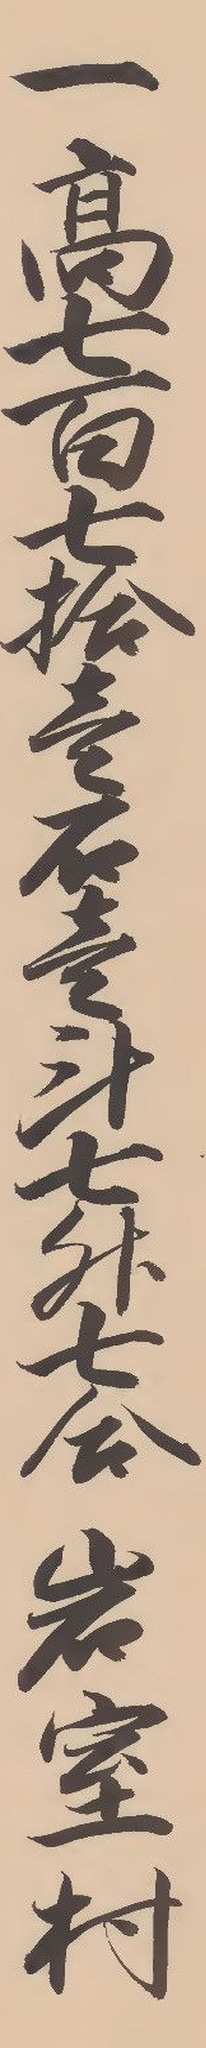一高七百七拾壱石壱斗七升七合岩室村
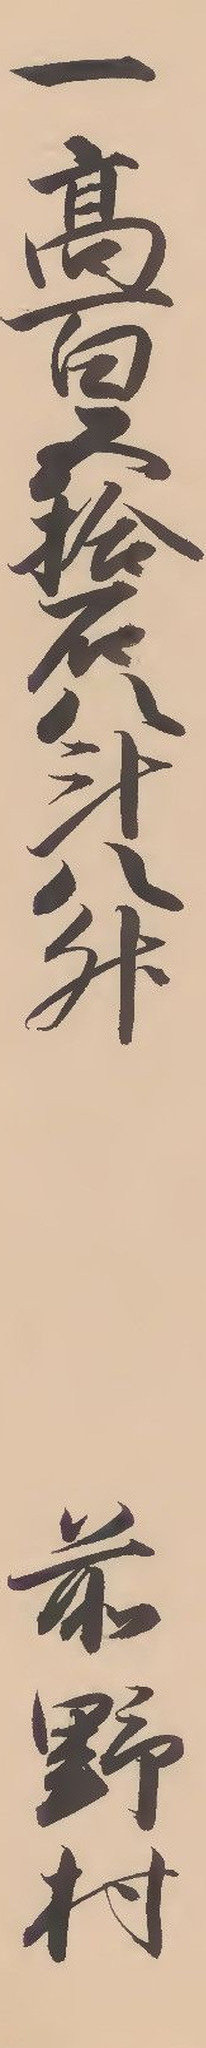一高百五拾石八斗八升前野村

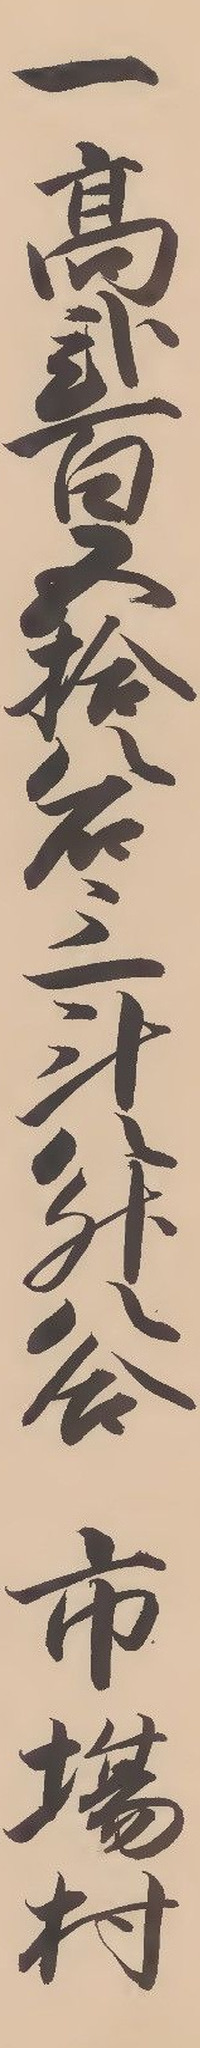一高弐百五拾八石三斗八升八合市場村
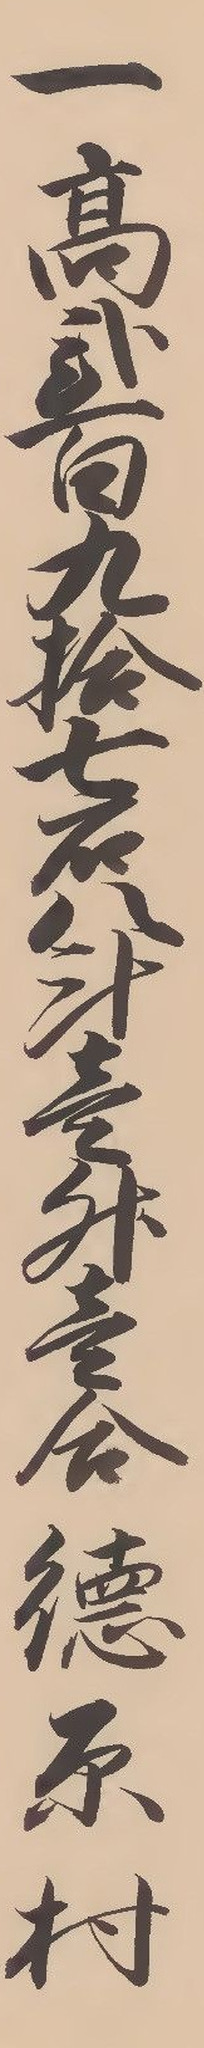一高弐百九拾七石八斗壱升壱合徳原村
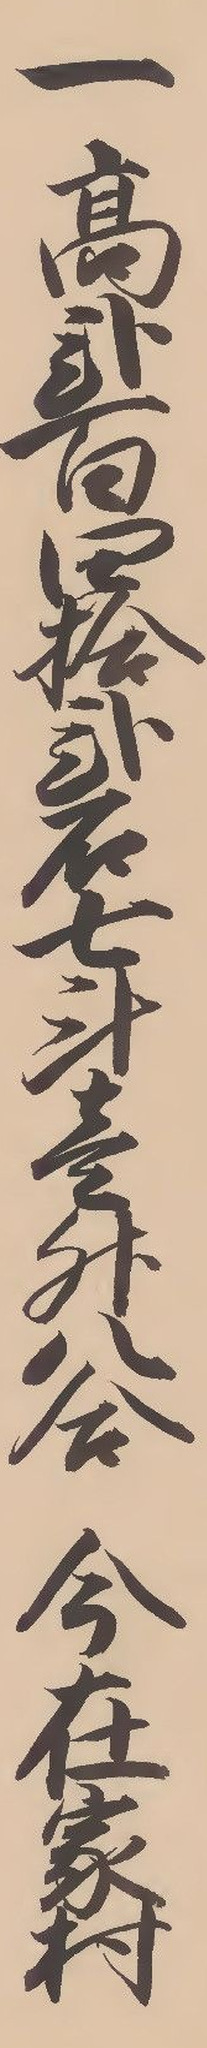一高弐百四拾弐石七斗壱升八合今在家村
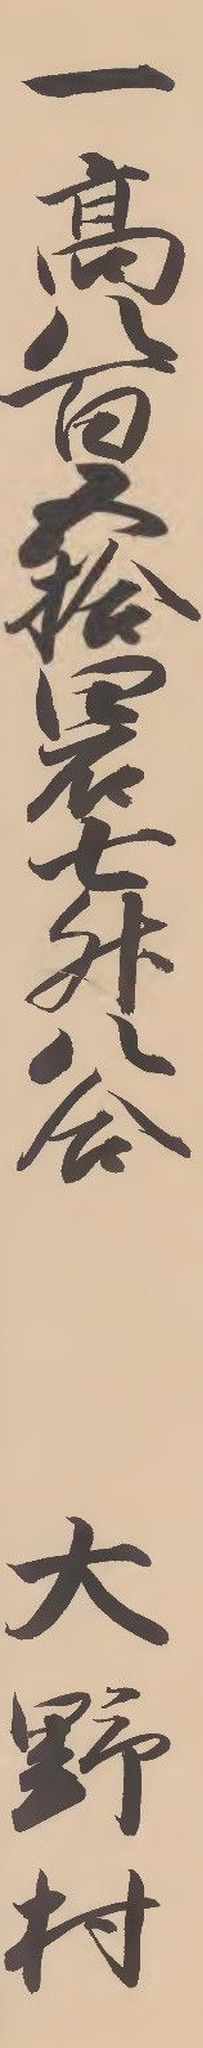一高八百五拾四石七升八合大野村
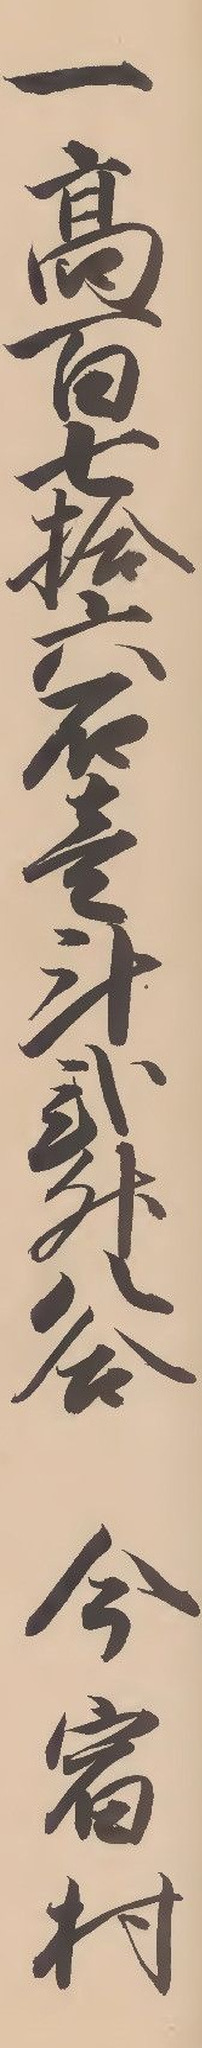一高百七拾六石壱斗弐升八合今宿村
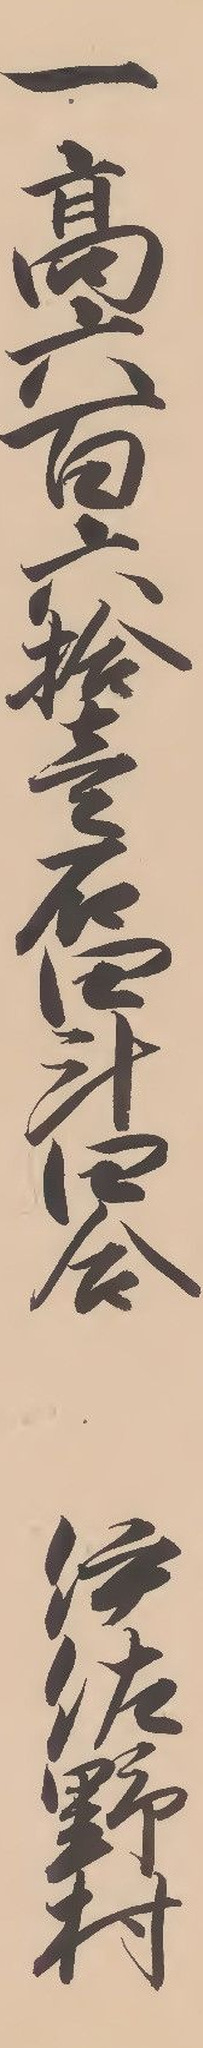一高六百六拾壱石四斗四合伊佐野村
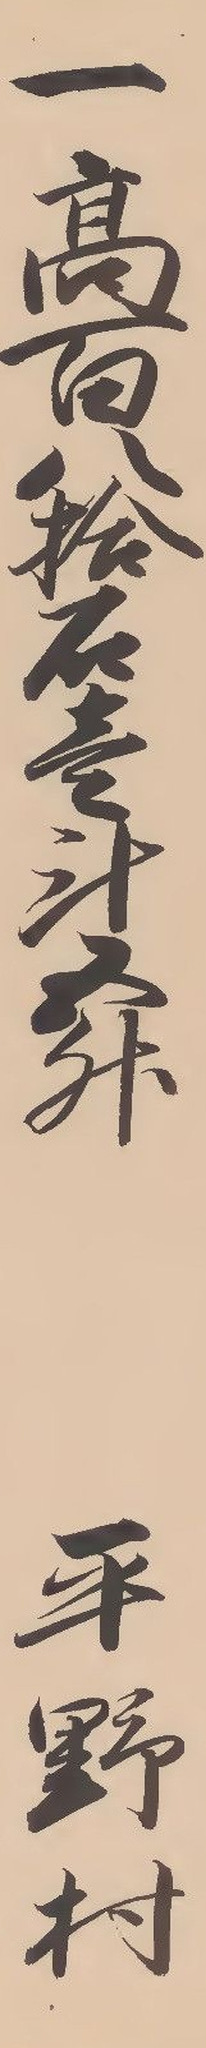一高百八拾石壱斗五升平野村
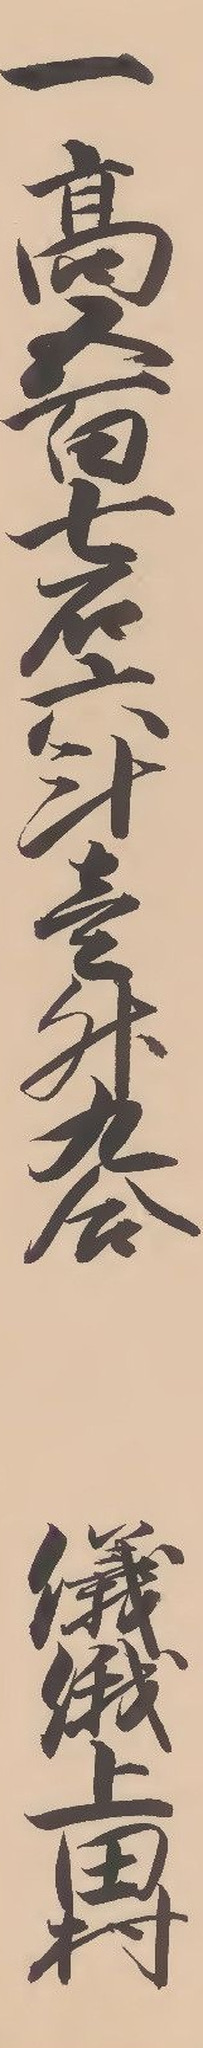一高五百七石六斗壱升九合儀俄上田村

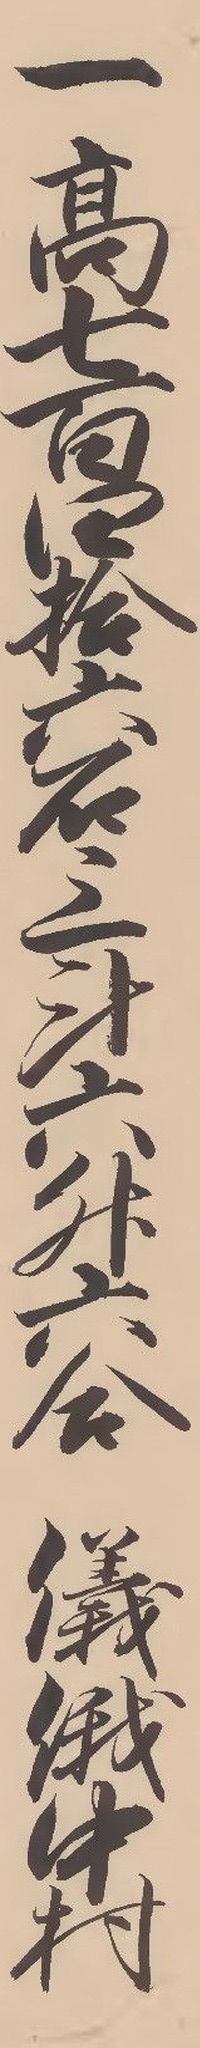一高七百四拾六石三斗六升六合儀俄中村
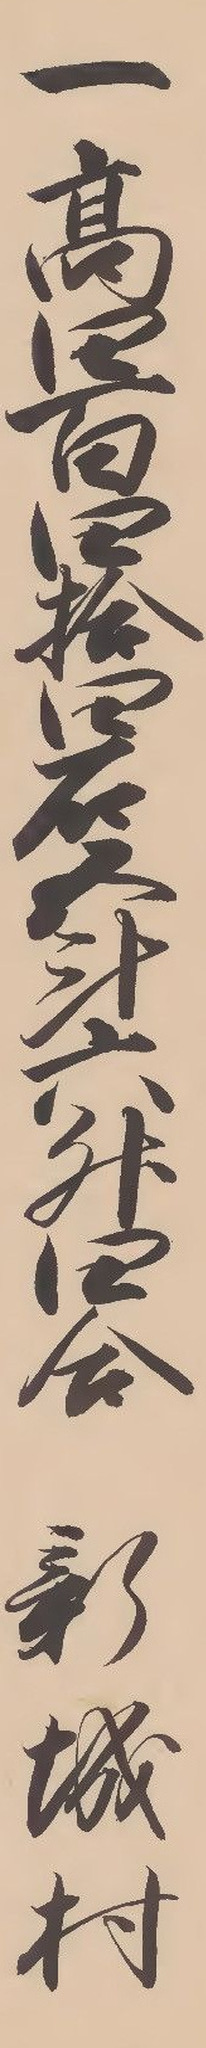一高四百四拾四石五斗六升四合新城村
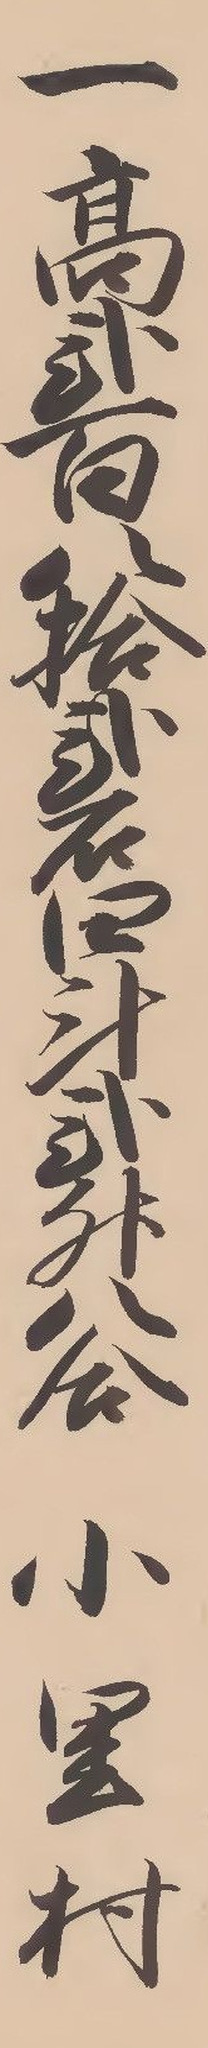一高弐百八拾弐石四斗弐升八合小里村
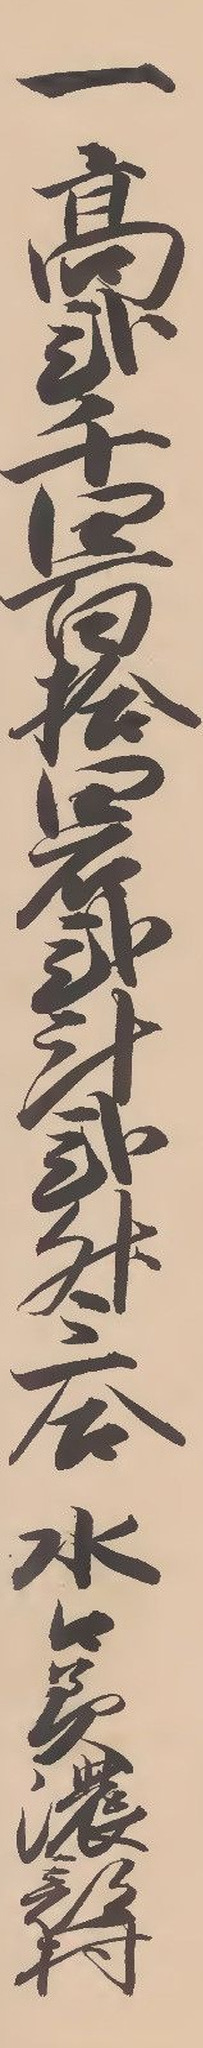一高弐千四百拾四石弐斗弐升三合水口美濃部村
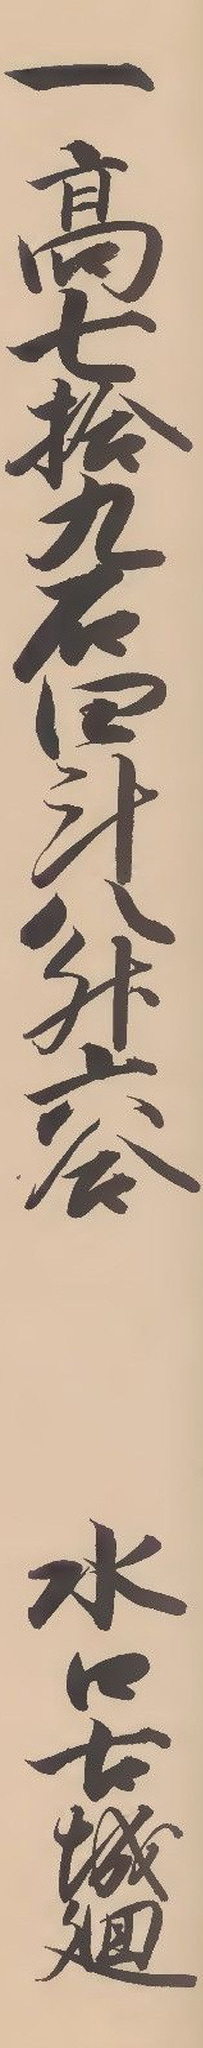一高七拾九石四斗八升六合水口古城廻
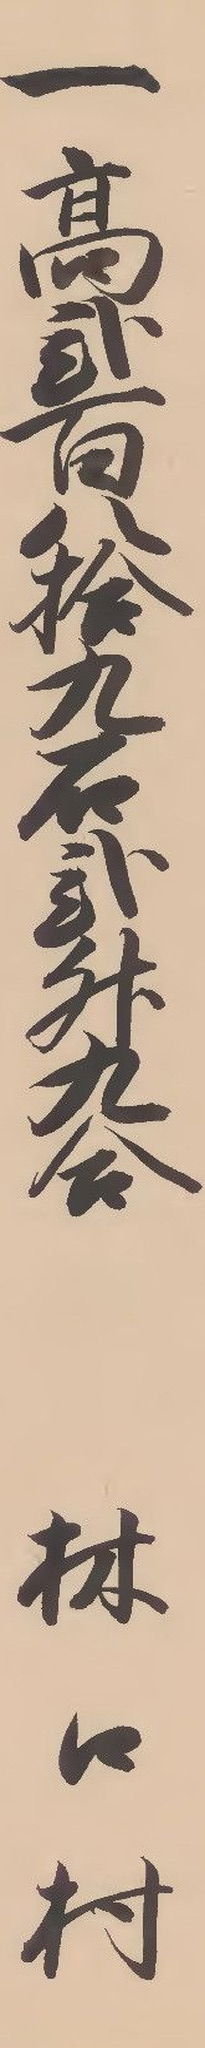一高弐百八拾九石弐升九合林口村
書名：近江国郷帳
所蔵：国立公文書館 National Archives of Japan
